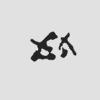冬
